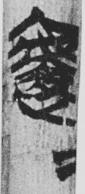○（襌衣）
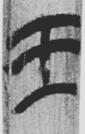王
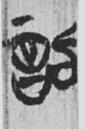訋（召）
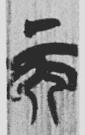而
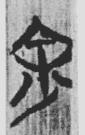○（余→予）
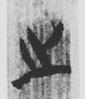之
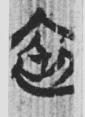○（領）
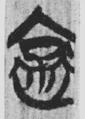○（袍）
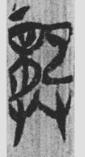龏（龔）
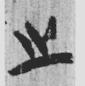之
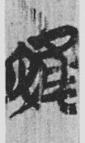○（脽）
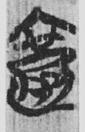被（披）
